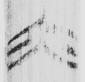亦
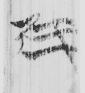隹
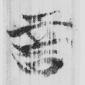酉
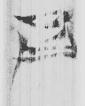甬
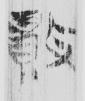{貝貝攴}
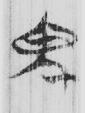畏
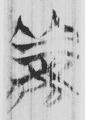義
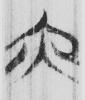亦
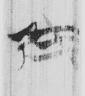隹
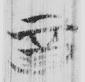酉
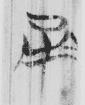甬
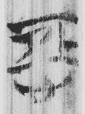{亙心}
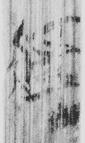{疒㞷}
